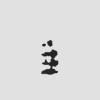金
